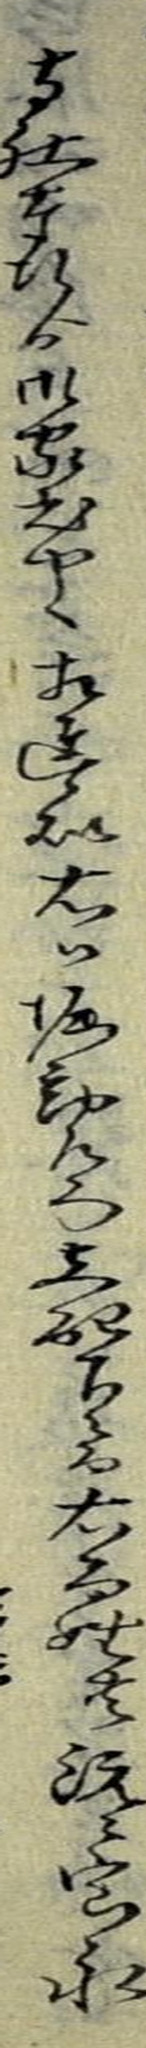寺社奉行ゟ御家老中へ相達候処右ハ堀勘左衛門支配下ニ而右百姓共既ニ宝永
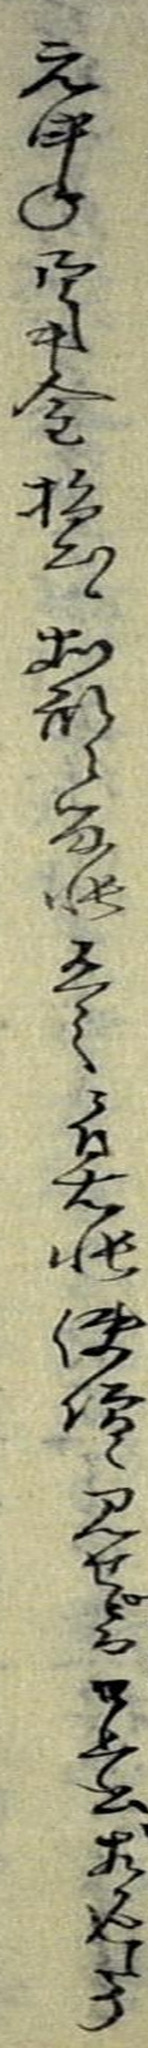元申年御用金指出候判形之留帳有之ニ付右帳使僧へ見せ可申旨ニ而口上書被相返候事

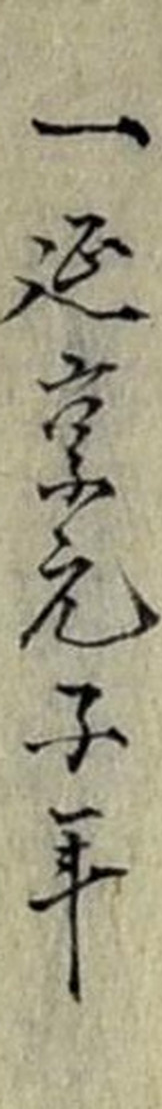一延享元子年
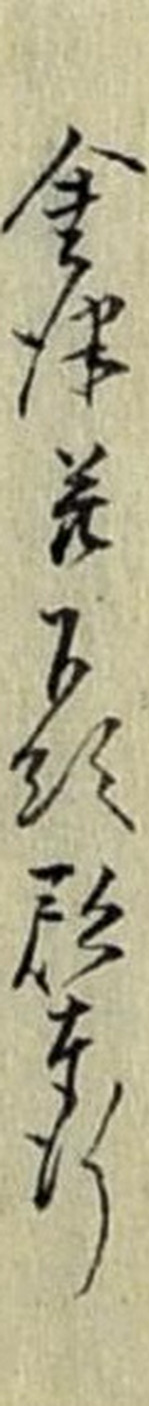金津并下領郡奉行
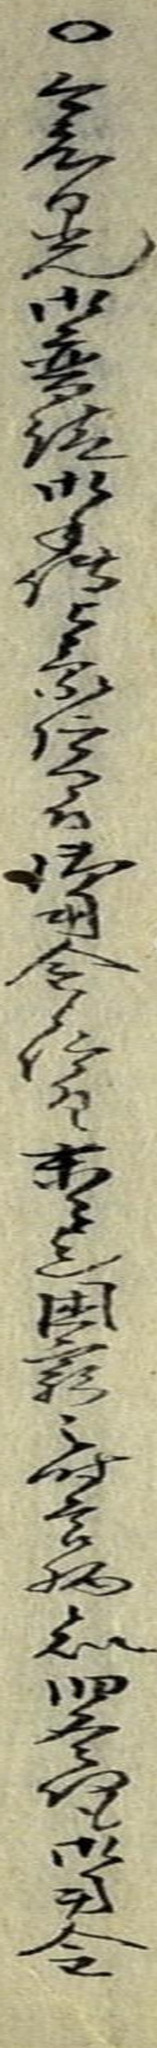〇今度日光御普請御手伝被蒙仰候ニ付御用金被仰付候末々迄困窮之時節柄候処旧冬何も御用金
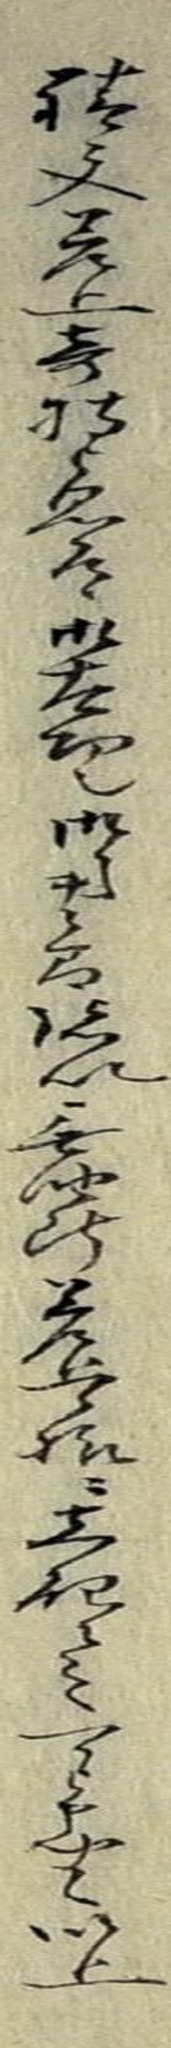精ニ入差上奇特被思召候御太切之御用候間弥以無油断差上候様ニ支配々々へ可被申聞候以上
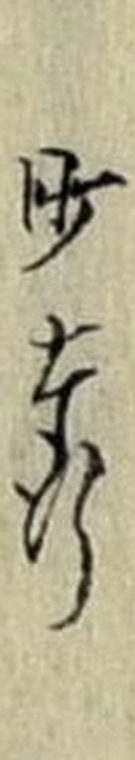町奉行
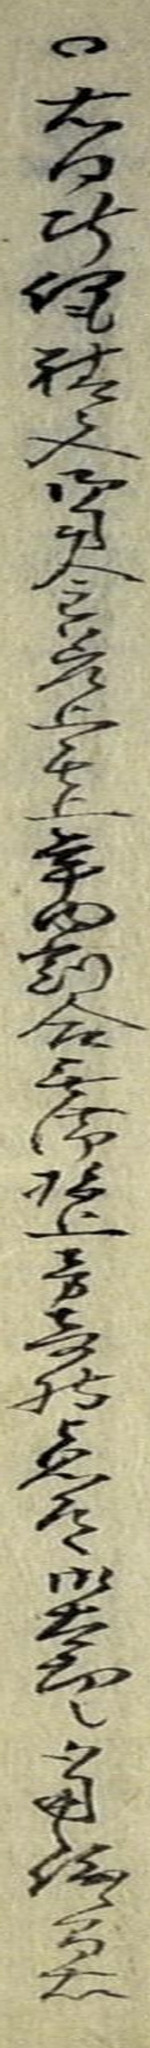〇右同断何も精ニ入御用金差上其上年内割合無滞指上旁奇特被思召候御太切之御用之儀候間右
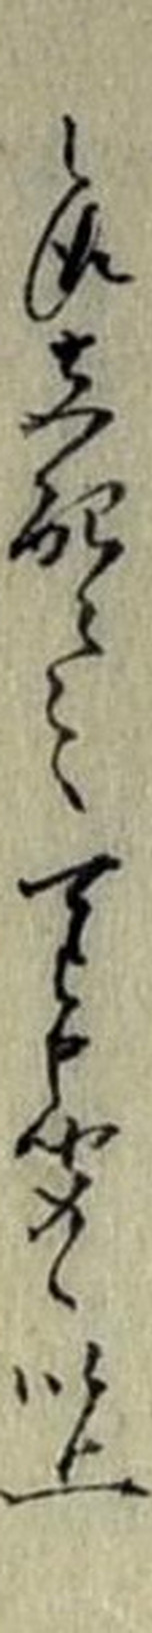之趣支配々々へ可被申聞候以上
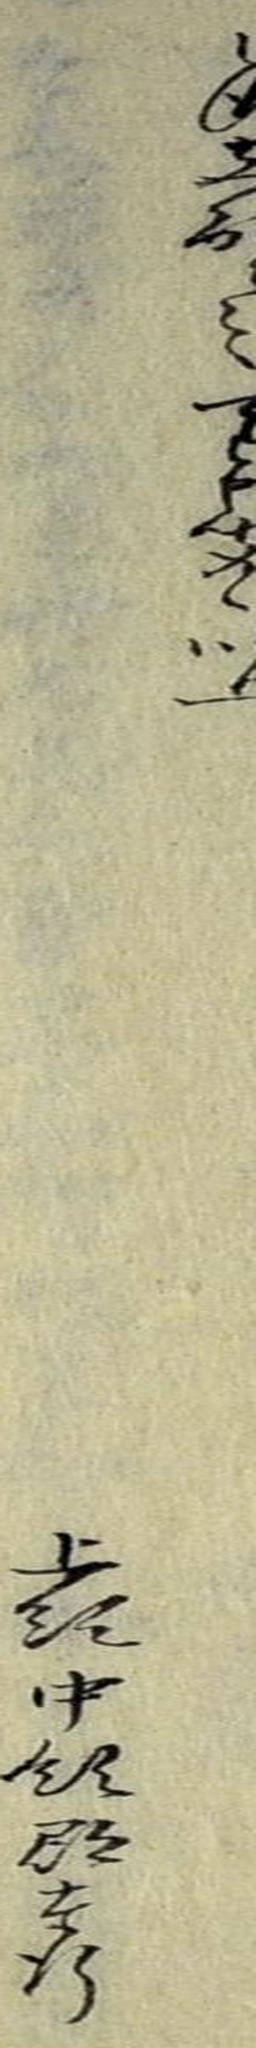上領中領郡奉行
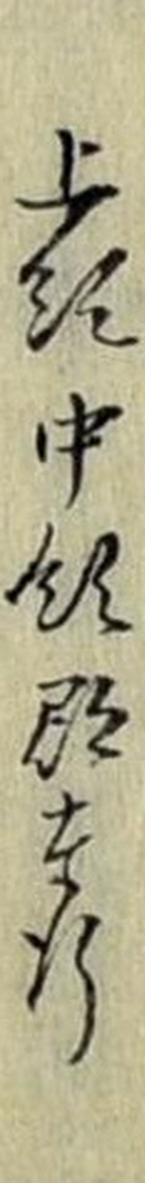上領中領郡奉行
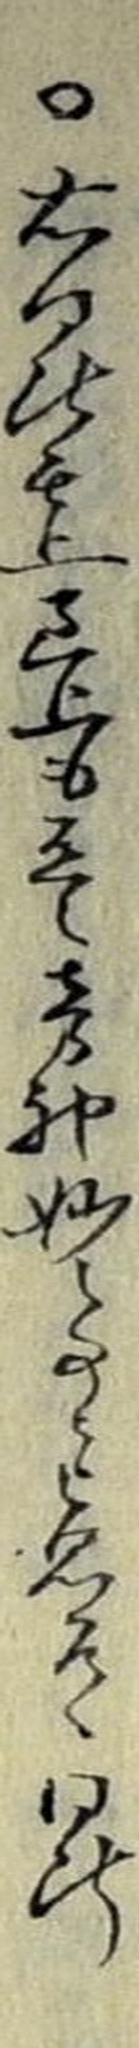〇右同断其上上も有之旁神妙之事ニ被思召候同断
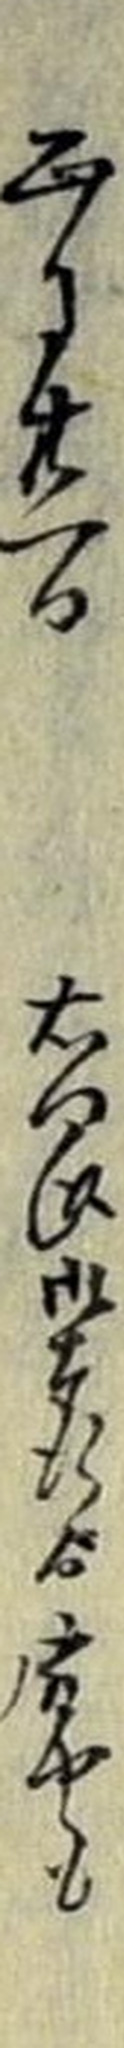正月廿一日右同趣御奉行ゟ府中へも
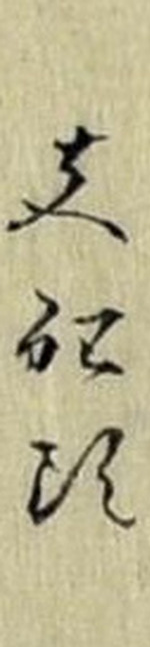支配頭
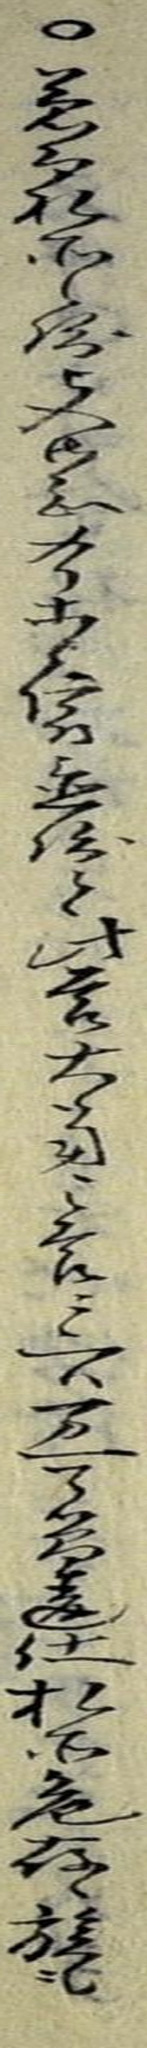〇兼而札所之儀被入御念〆り等被仰付置儀ニ候此節右御用之節ニ候ヘハ万一了簡違仕札所危存候族も
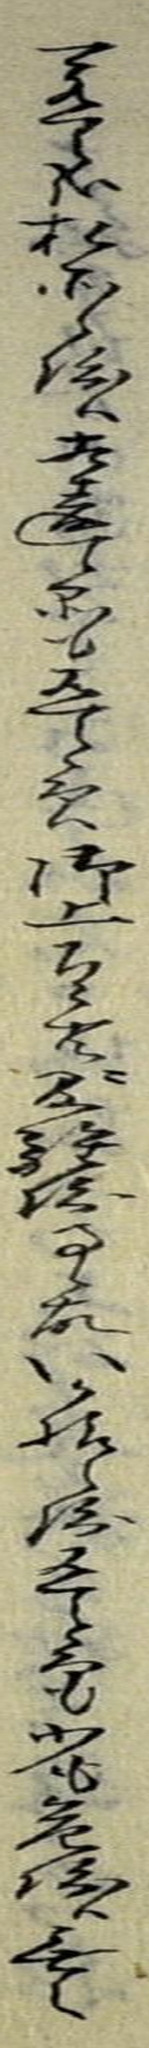可有之哉札所之儀ハ相違之品も有之候而ハ御上下々共ニ及難儀事候故いか様之儀有之候而も少も危儀ハ無之
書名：命令之部 一
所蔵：福井県文書館 Fukui Prefectural Archives
